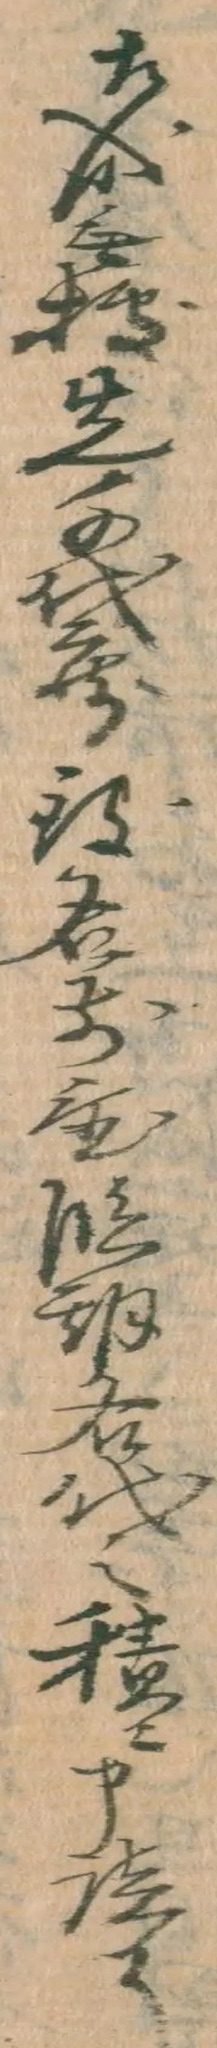相成無拠先手代蔵致名前置段期右代之積ニ申談了
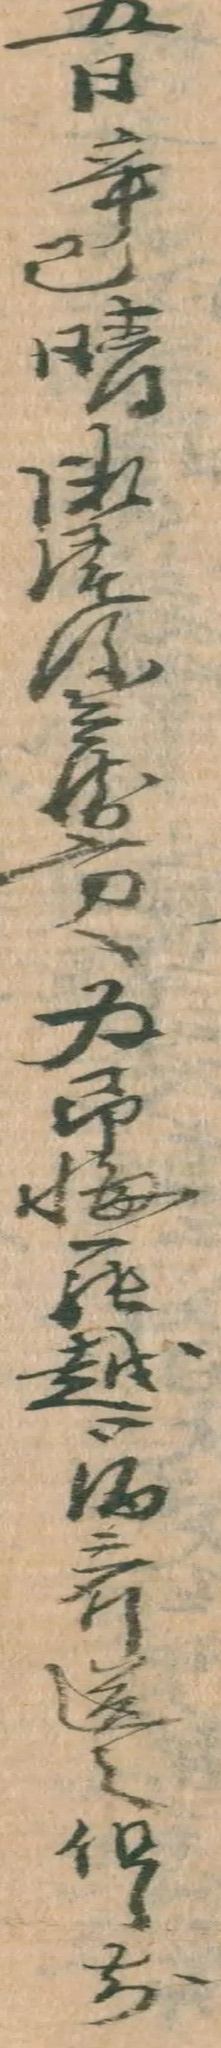五日辛巳晴瀬尾弥兵衛方へ為弔悔罷越御酒三升送之但し前
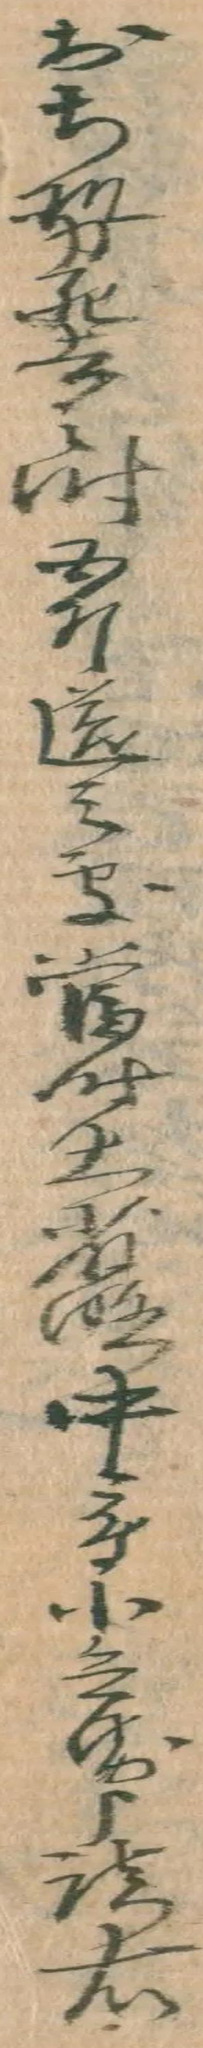おち勢死去之時五升送之處當時大省略中ニ付小兵衛申談右
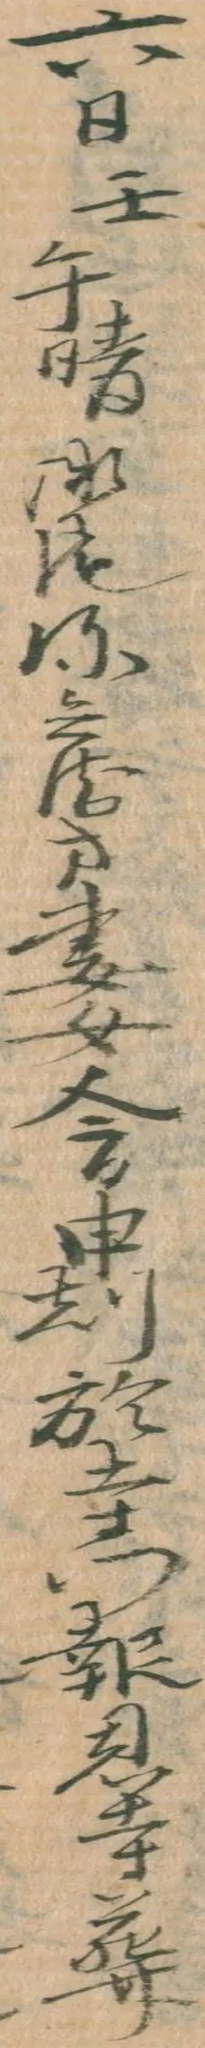六日壬午晴瀬尾弥兵衛方妻女今日申刻於寺門報恩寺葬
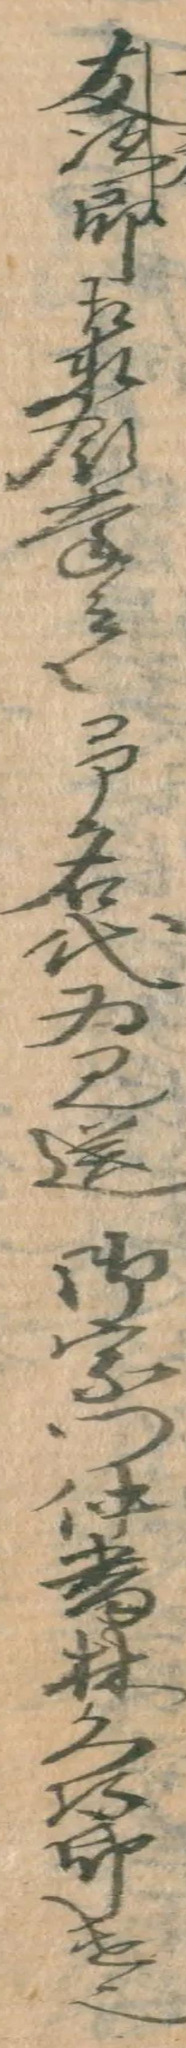乙若相頼領掌云〻予名代為見送御家門仲番林久次郎遣也
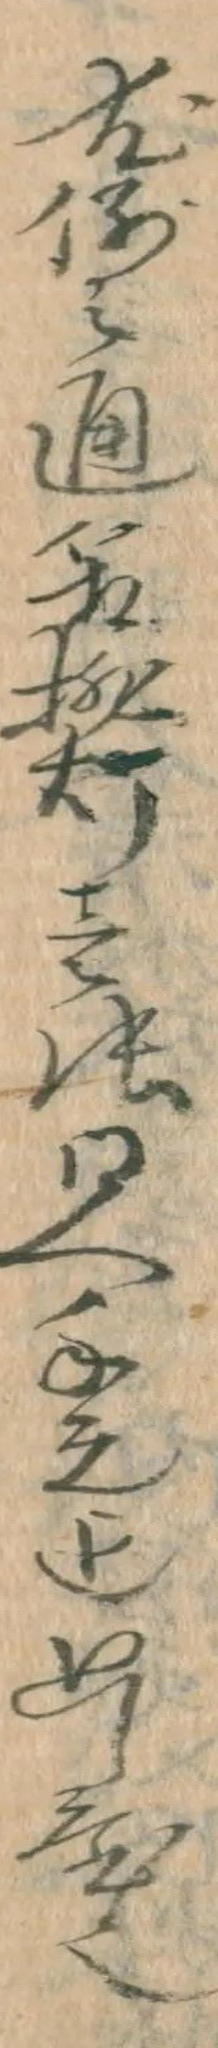尤例之通箱挑灯壱張同人手元迄廻し置也
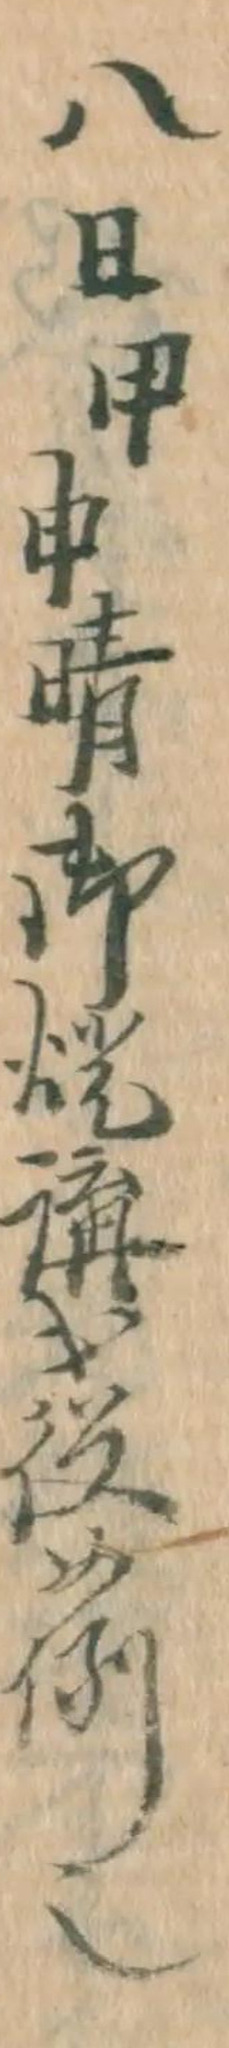八日甲申晴御燈講出役如例也
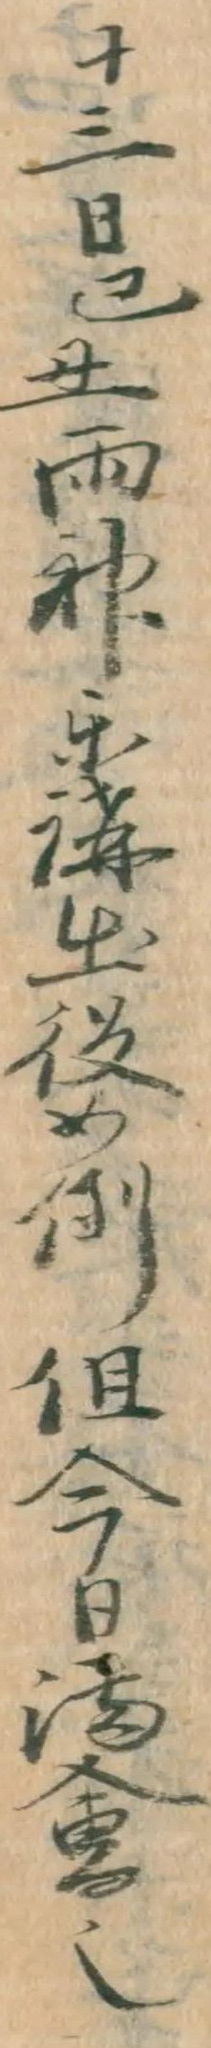十三日已丑雨神楽講出役如例但今日満會也

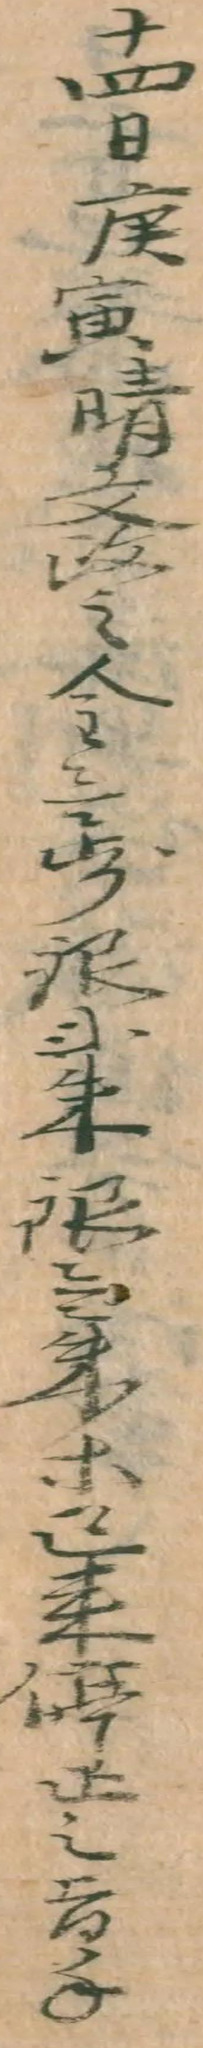十四日庚寅晴文政之金壱歩銀弐朱銀壱朱等已来停止之旨手
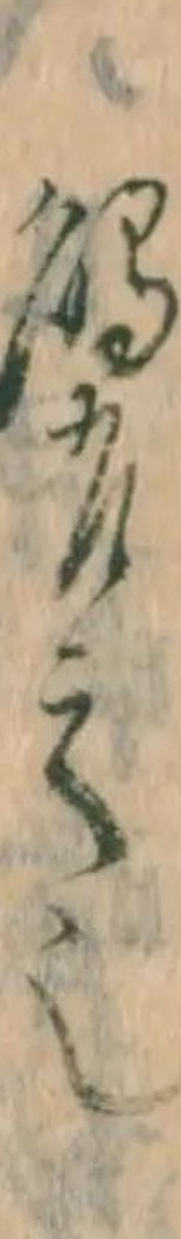觸有之也
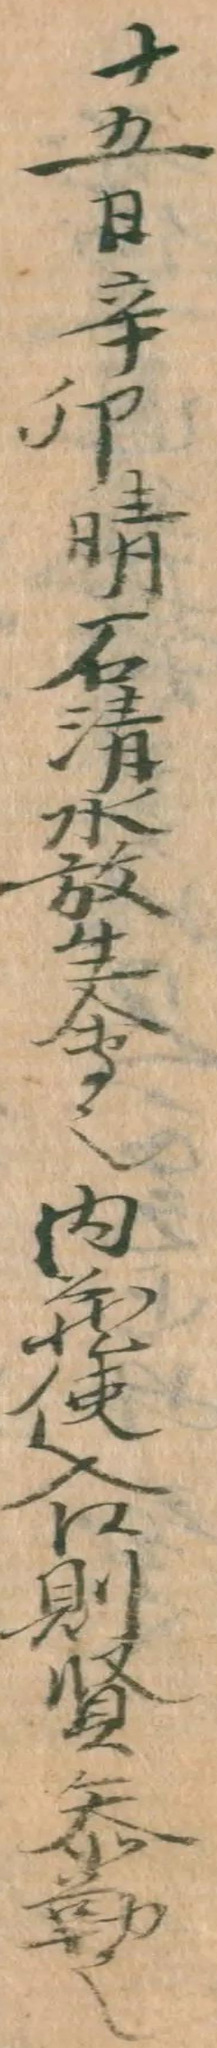十五日辛卯晴石清水放生會也内蔵使入江則賢参勤也
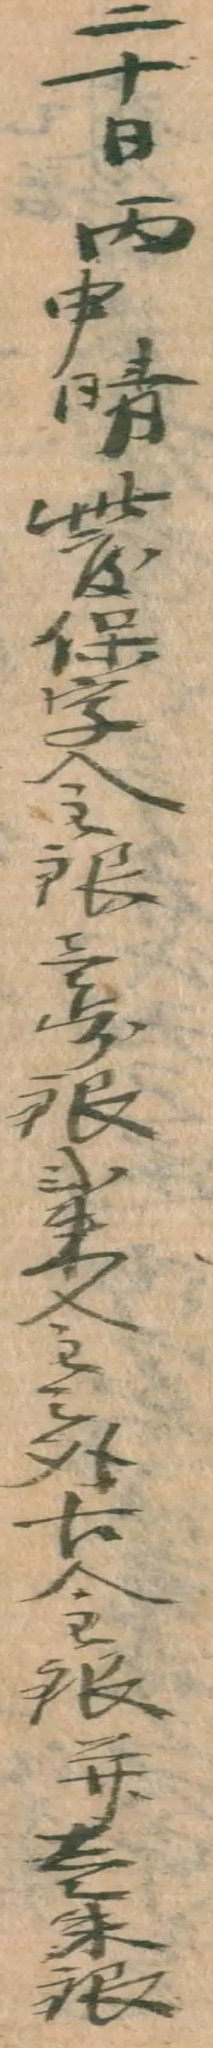二十日丙申晴此度保字金銀壱歩銀弐朱金之外古金銀幷壱朱銀
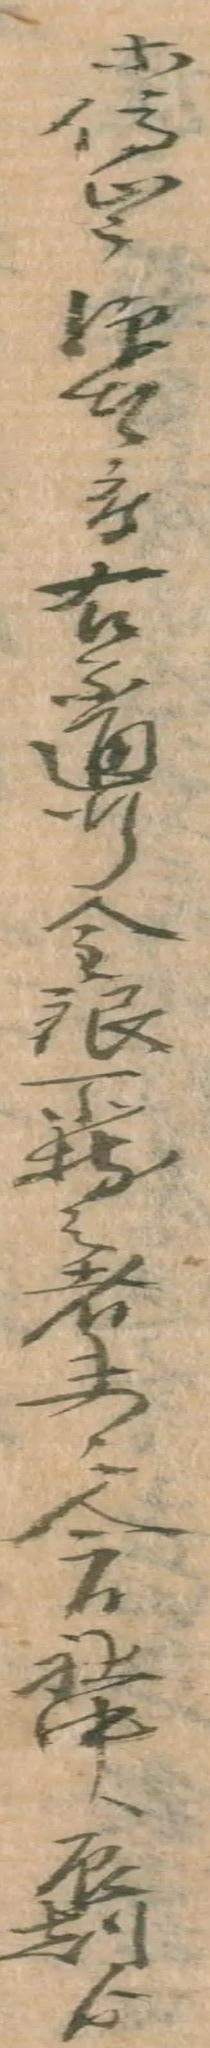等停止被仰出候ニ付右不通行金銀所持之者夫々今日社中へ辰刻ゟ
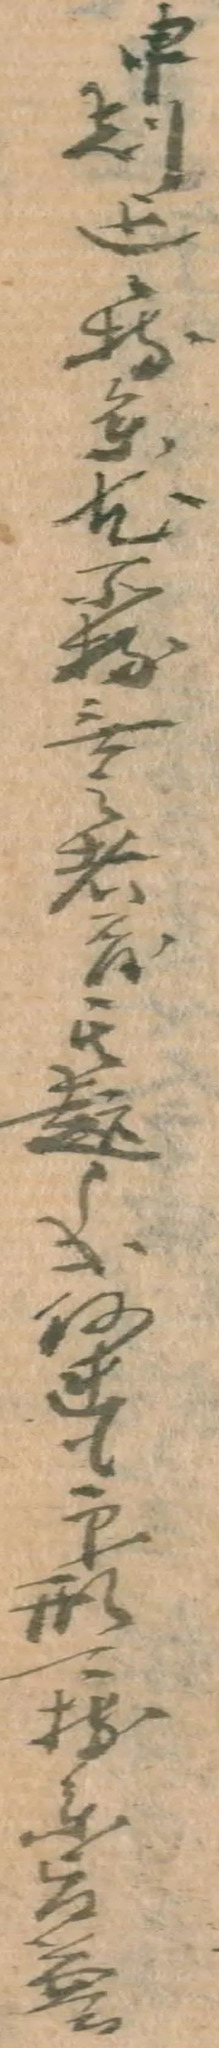申刻迄持参尤所持無之者も其趣申出何れも印形可持参旨兼而
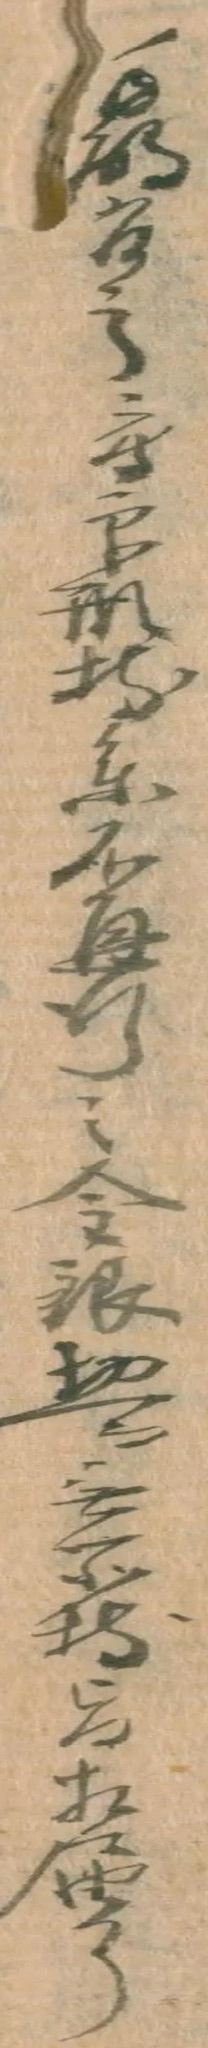手觸有之ニ付印形持参不興行之金銀惣而無所持旨相届了
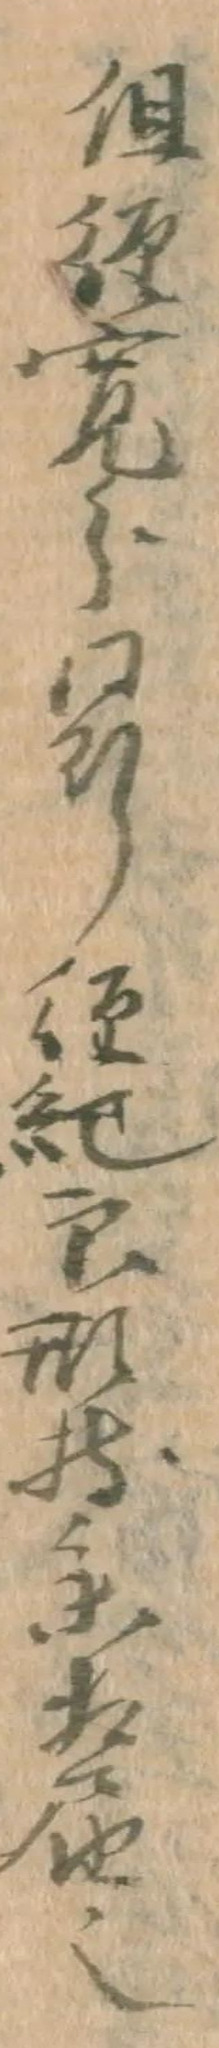但経寛分同断経紀印形持参相届也
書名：賀茂社記録. 第69冊
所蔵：国立国会図書館 National Diet Library, JAPAN
